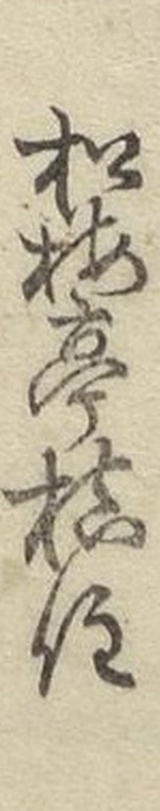松梅亭槙住
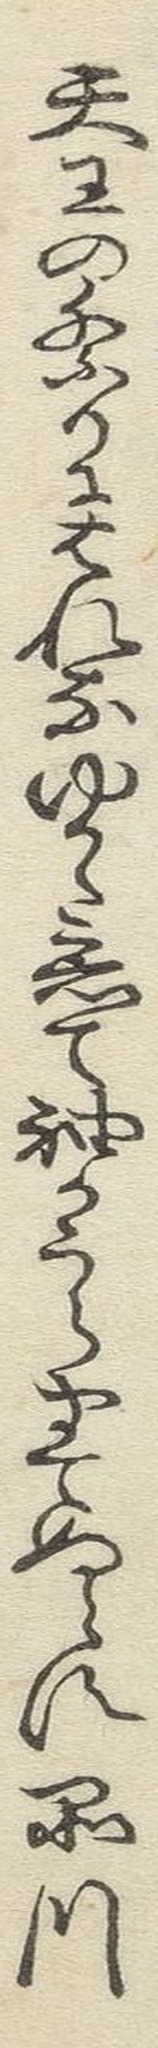天王の祭りにはれなゆかた着てかうらまてぬら
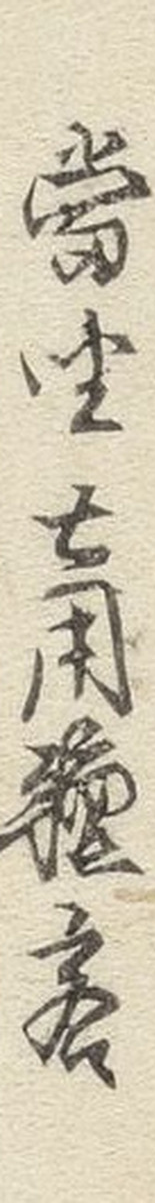当座土用鱣客
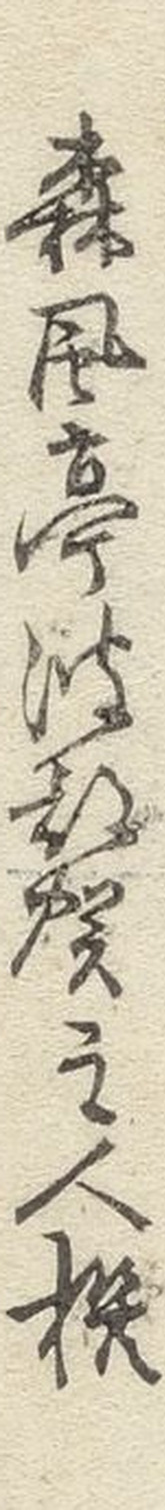森風亭波都賀主人撰
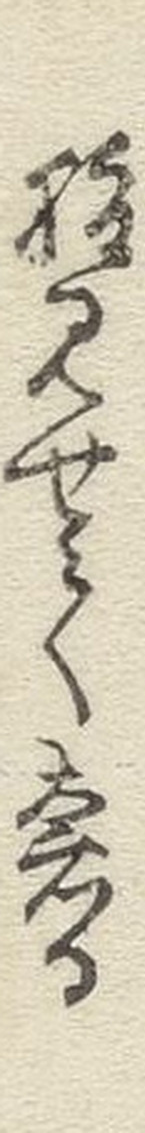腹見せて奢る
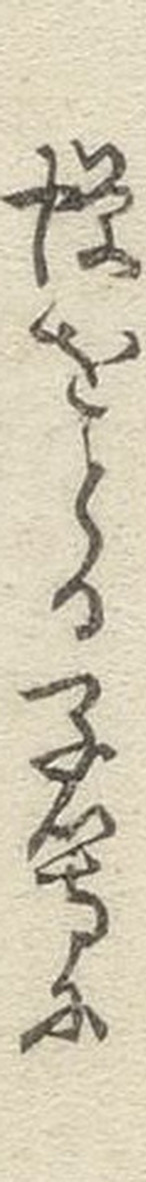蝉をとる子等に
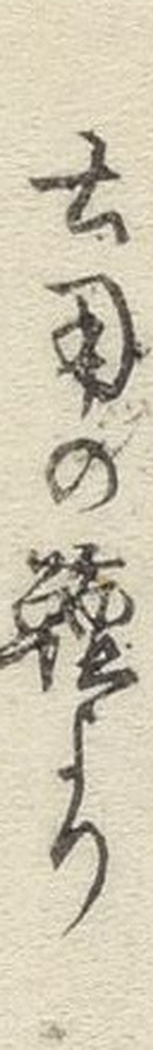土用の鱣より
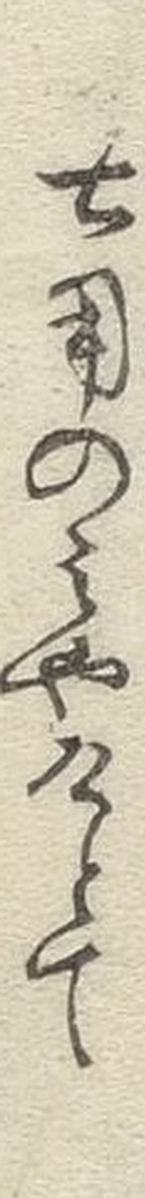土用のみやけとて
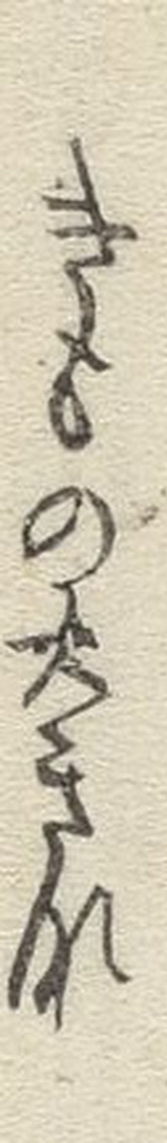きもの大きな
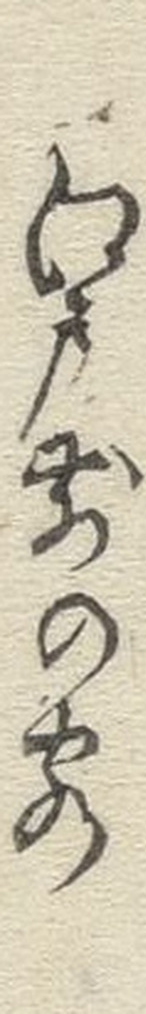江戸前の客
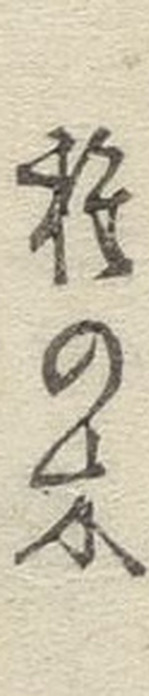椎の木
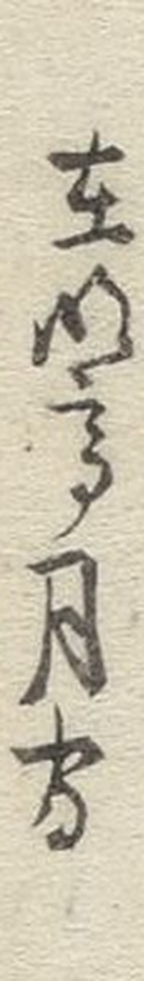在明亭月守
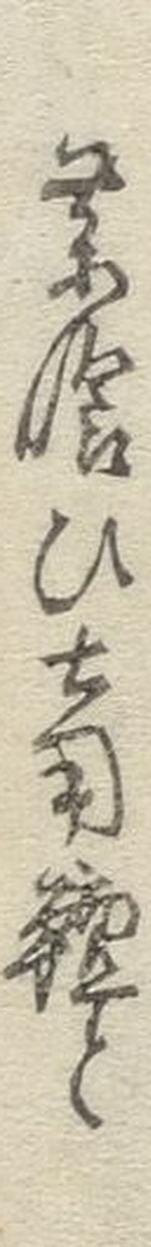薬喰ひ土用鱣と
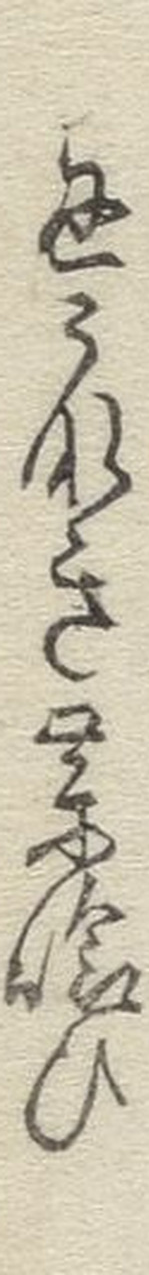丑うなき薬喰ひ
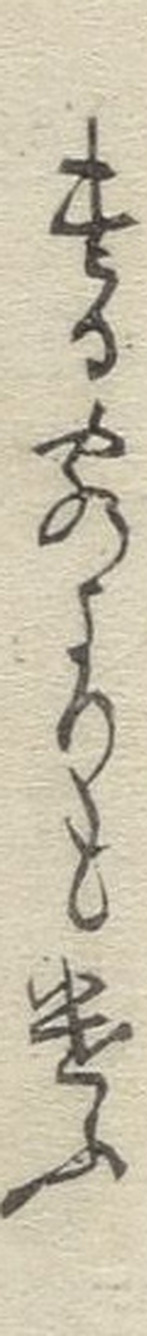する客よりも遣う
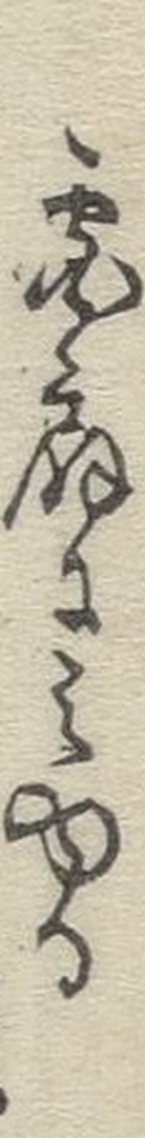団扇にみゆる
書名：Picture Album of People with Kyōka (Light Verse) (Kyōka shiki jinbutsu 狂歌四季人物)
